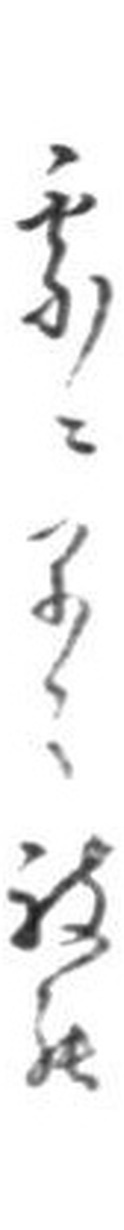処に早々被罷
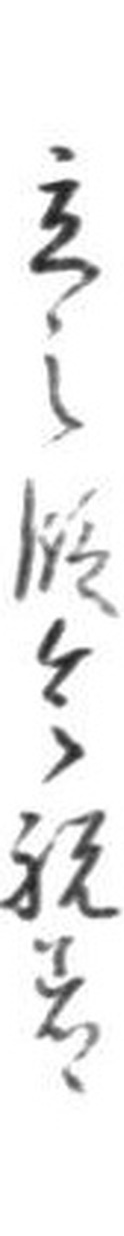立之段令祝着候
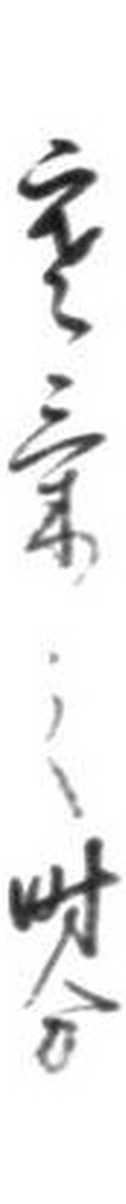寒気之時分

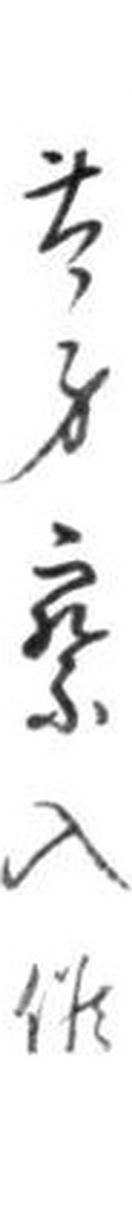苦身察入候
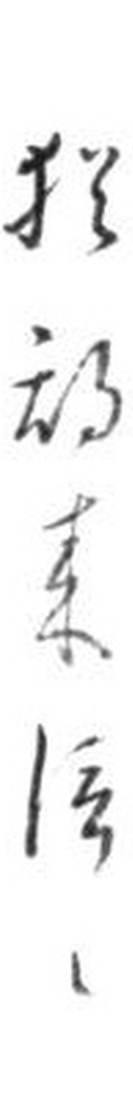猶期来信候
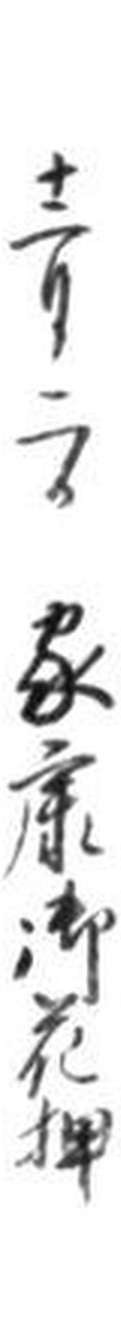十二月二日家康御花押
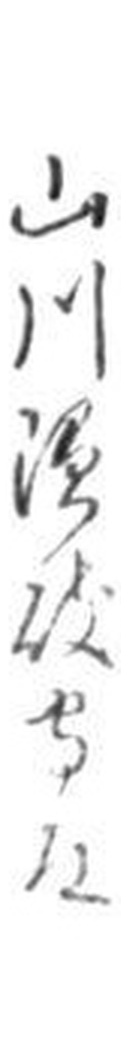山川讃岐守殿
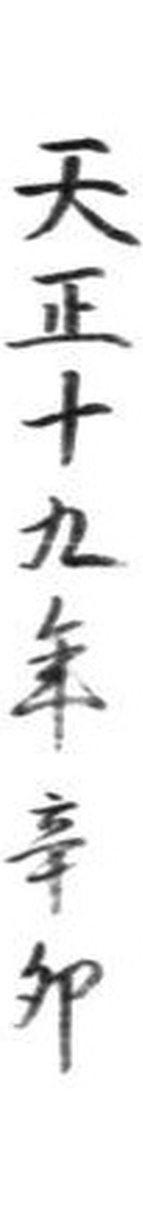天正十九年辛卯
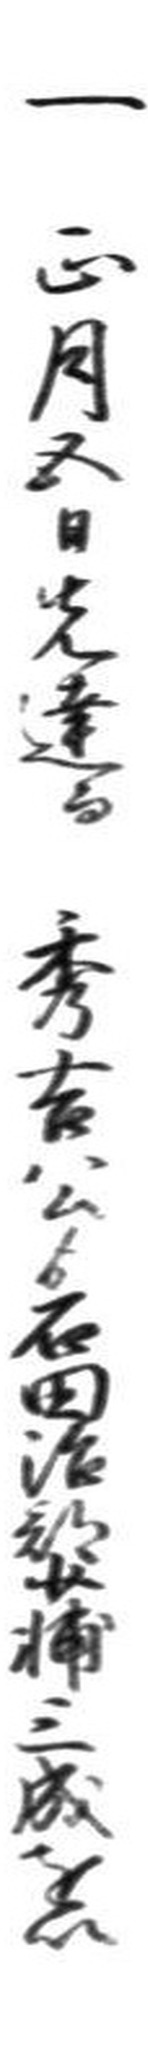一正月五日先達而秀吉公ゟ石田治部少輔三成を以
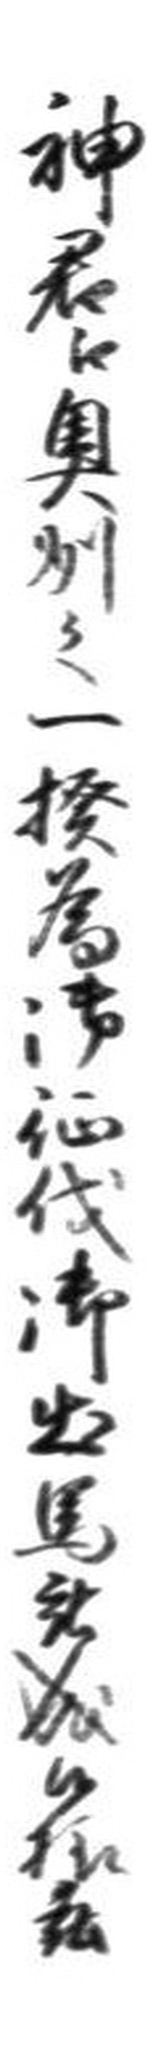神君江奥州之一揆為御征伐御出馬被成候様被
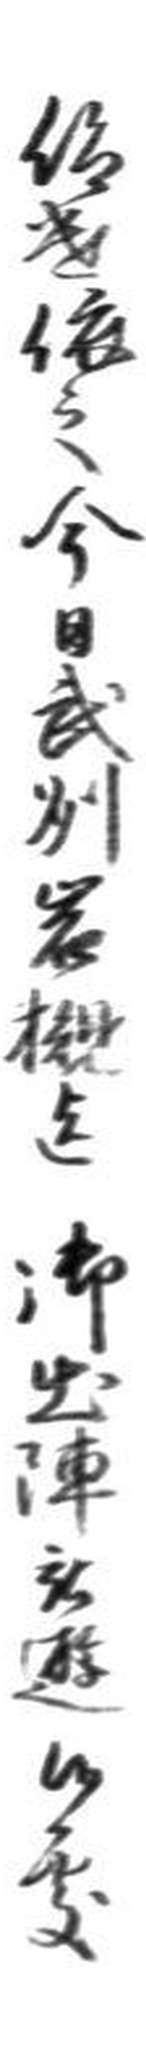仰遣依之今日武州岩槻迄御出陣被遊候処
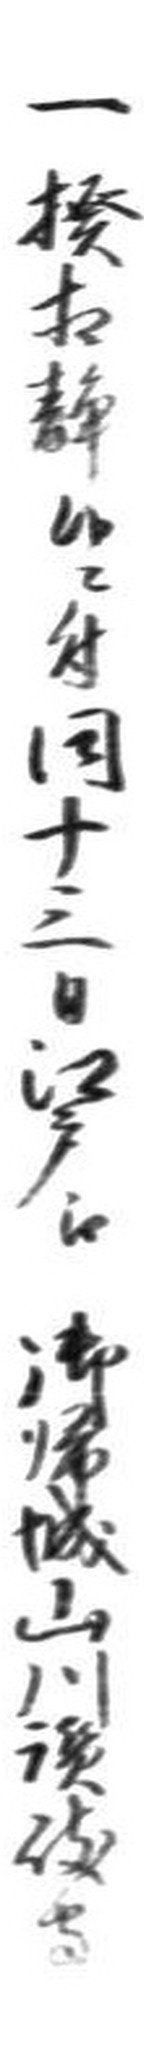一揆相静候ニ付同十三日江戸江御帰城山川讃岐守
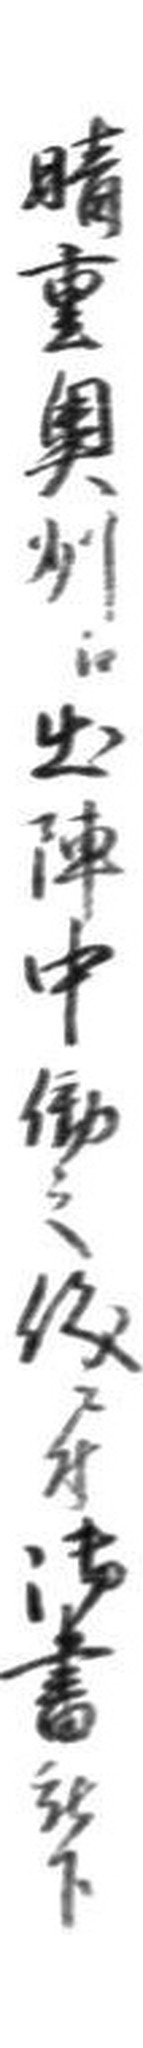晴重奥州江出陣中働之儀ニ付御書被下
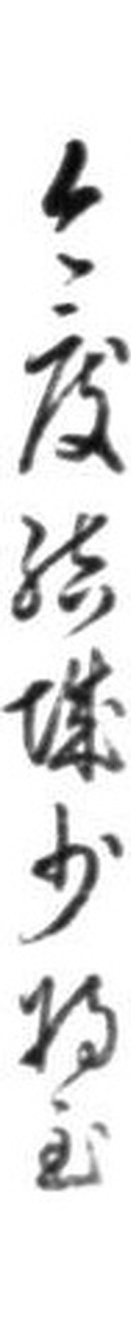今度結城少将至
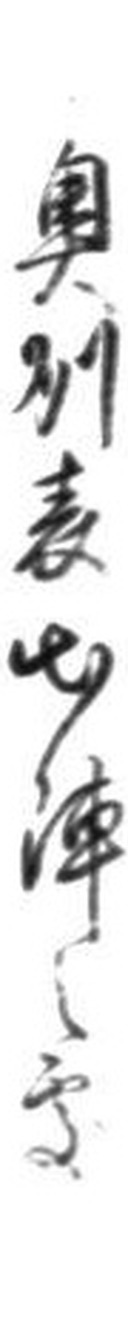奥州表出陣之処

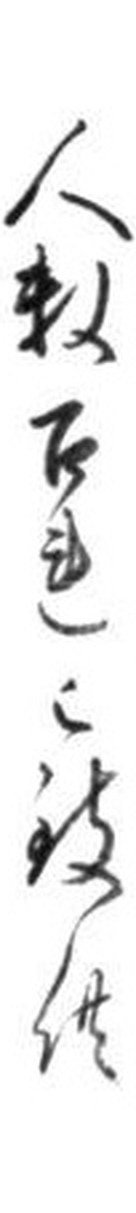人数召連被致供
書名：家譜 一 秀康公 従天正二年到慶長十二年
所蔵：福井県文書館 Fukui Prefectural Archives
